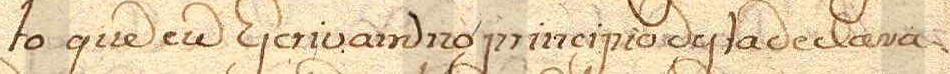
to que eu Escrivam no principio desta declara
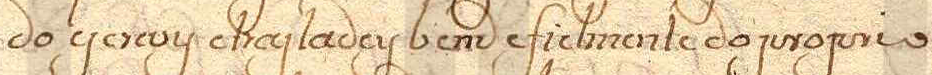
do escrevy e trasladey bem e fielmente do proprio
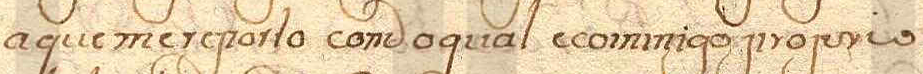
a que me reporto com o qual e commigo proprio
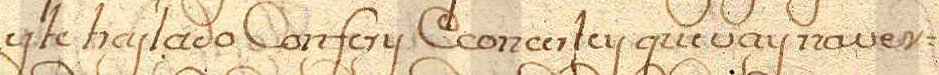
este traslado Confery e concertey que vay na ver
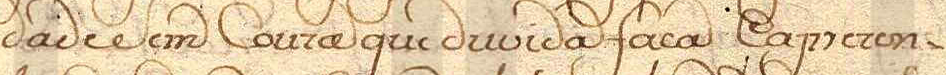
dade Sem Couza que duvida faça e a prezen
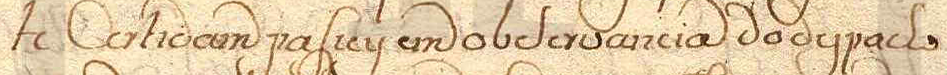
te Certidam passey em observancia do despacho
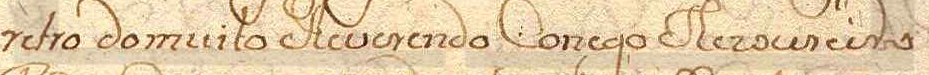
retro do muito Reverendo Conego Thezoureiro
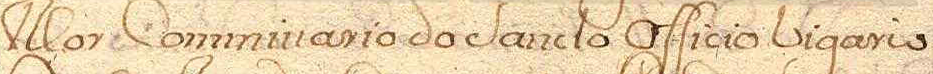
Mor Commissario do Sancto officio Vigario
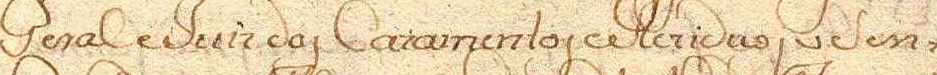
Geral e Iuiz dos Cazamentos e Reziduos o Sen
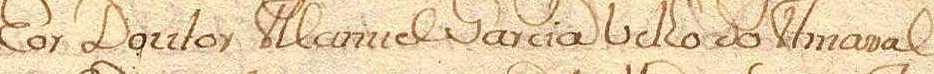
hor Doutor Manuel Garcia Velho do Amaral
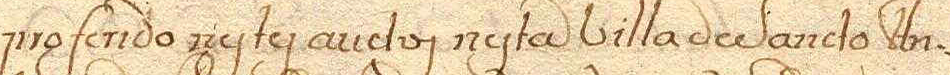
proferido nestes auctos nesta villa de Sancto An
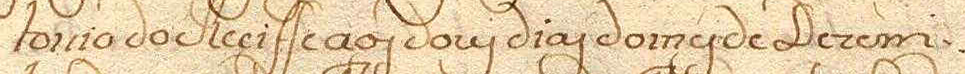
tonio do Reciffe aos dous dias do mes de Dezem
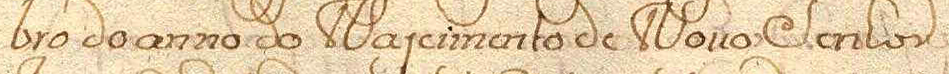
bro do anno do Nascimento de Nosso Senhor
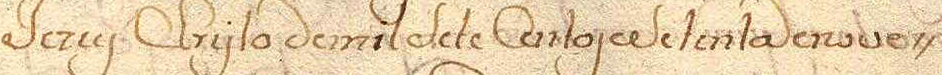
Iezus Christo de mil SeteCentos e setenta e nove//
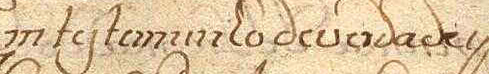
Em testemunho de verdade//
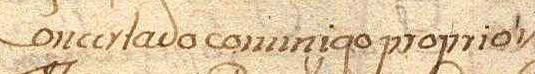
Concertado commigo proprio//
